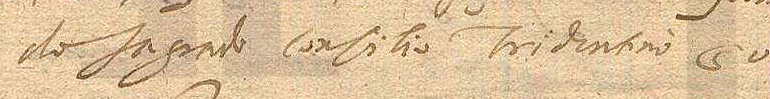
do sagrado conCilio Tridentino q̄ o
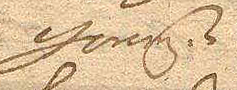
escreuj.
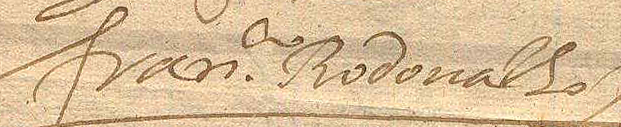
fran.co Rodoualho
